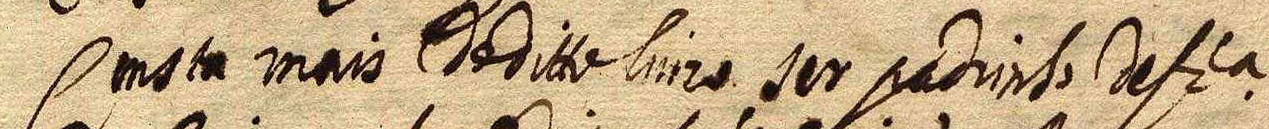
Consta mais do ditto liuro ser padrinho de frca.
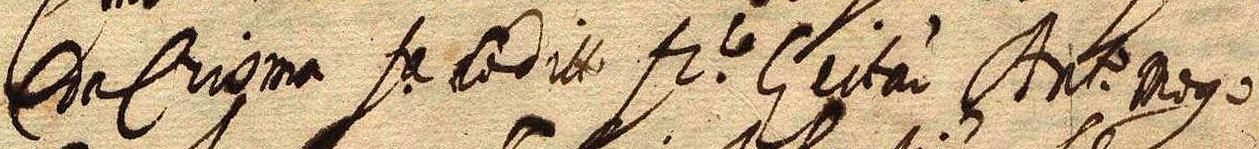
da Crisma f.a do ditto fr.co Leitaõ Ant.o mogo
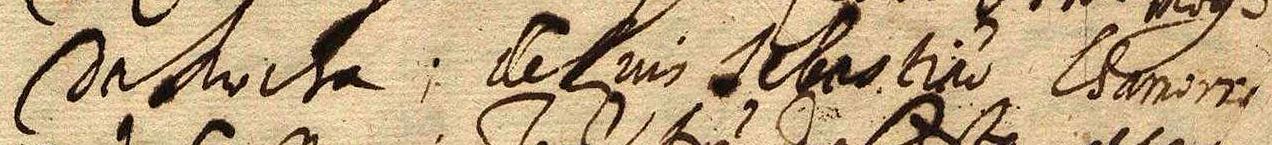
da Rocha, de Luis sebastiaõ Chamorro
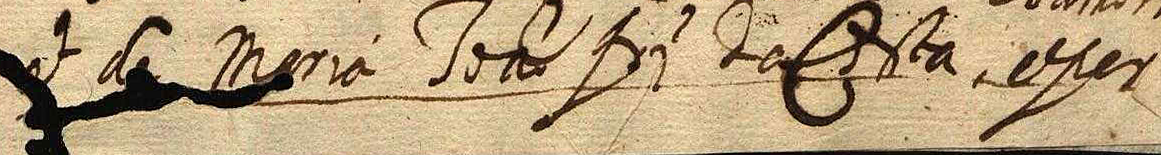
& de maria Ioaõ frz̄ da Costa, e per
